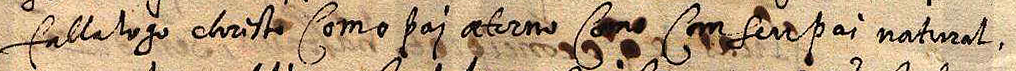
falla logo christo Como paj æterno Como Com seu pai natural,
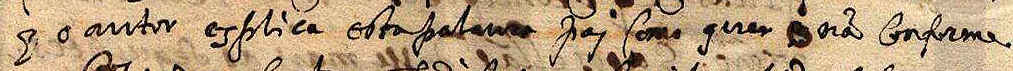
E o autor esplica esta palaura paj Como quer _ naõ Conforme
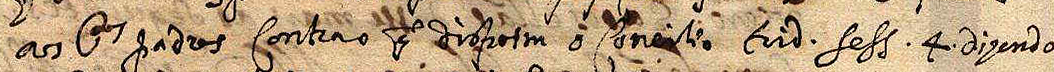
aos stos padres Contra o q̄ dispoim o Concilio trid. sess. 4. dizendo
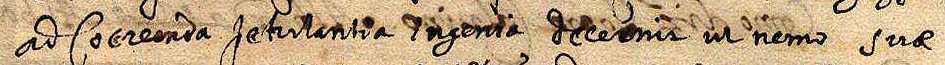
ad Coerenda petulantia ingenia decernit ut nemo suæ
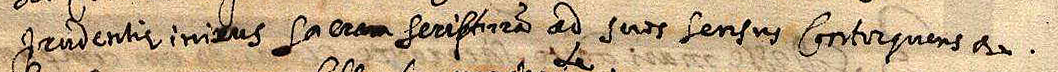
prudentis inixus sacram scripturā ad suos sensus Contorquens &c.
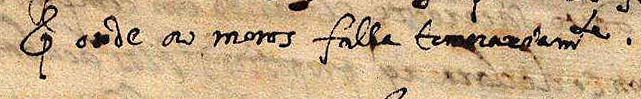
p̄o onde ao menos falla temerariamte.
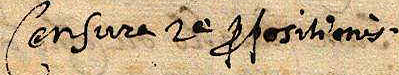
Censura 2a ꝓpositionis.
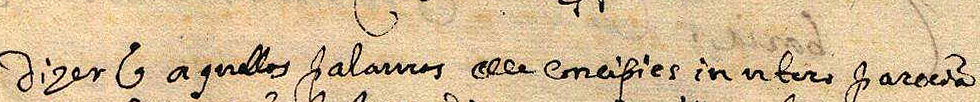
dizer q̄ aquellas palauras ecce concipies in utero pareciā
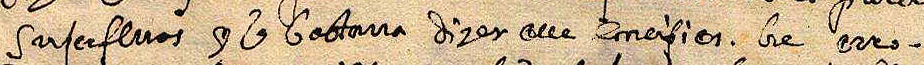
Superfluas E q̄ bastaua dizer ecce concipies. he erro
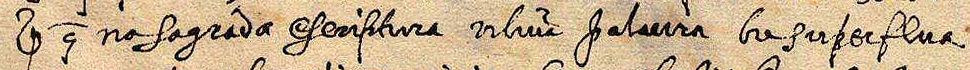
p̄o q̄ na sagrada escriptura nhuā palaura he superflua
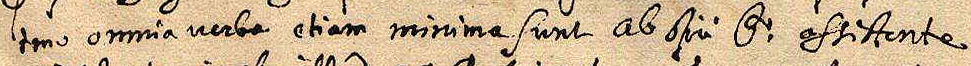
imo omnia uerba etiam minima sunt ab spū s.to assistente
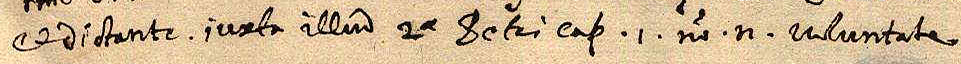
& dictante. iuxta illud 2a Petr cap. 1. nō n. uoluntate
